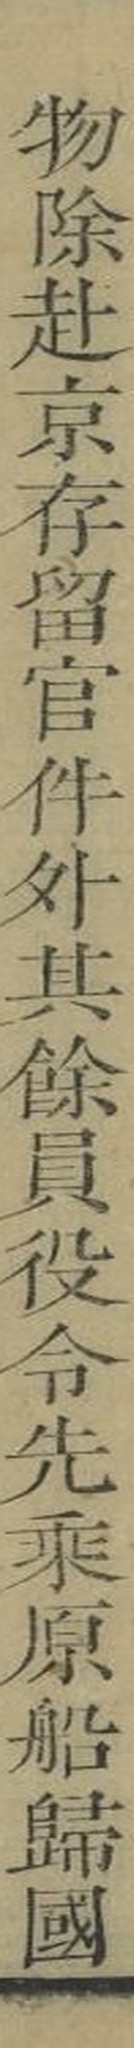物除赴京存留官件外其余員役令先乗原船帰国
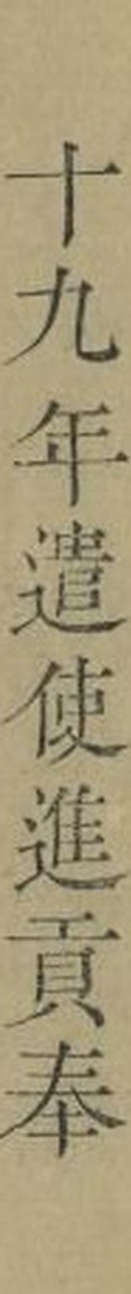十九年遣使進貢奉
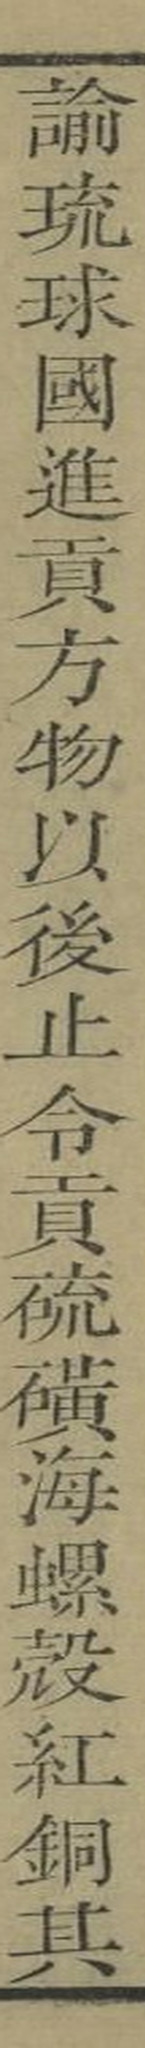諭琉球国進貢方物以後止令貢硫磺海螺殻紅銅其
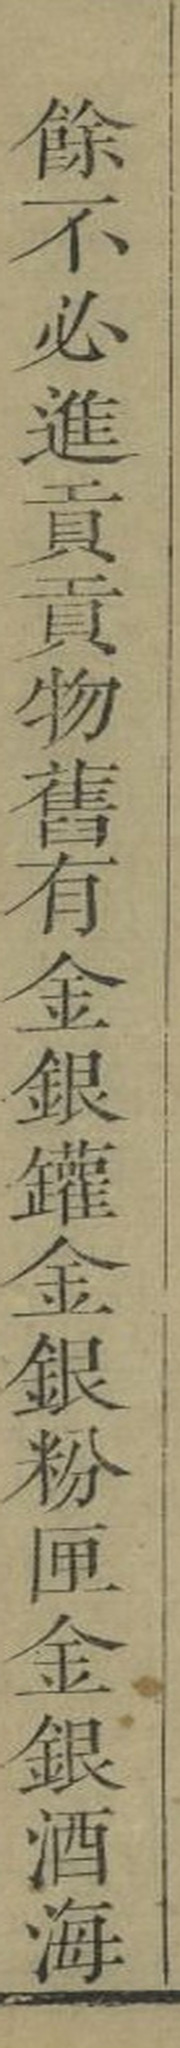余不必進貢貢物旧有金銀缶金銀粉匣金銀酒海
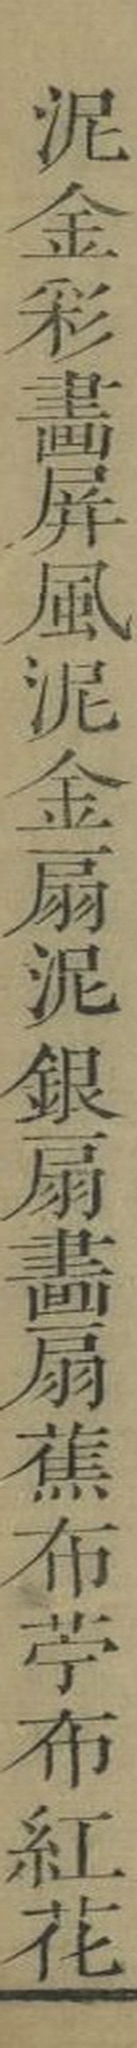泥金彩画屏風泥金扇泥銀扇画扇蕉布苧布紅花

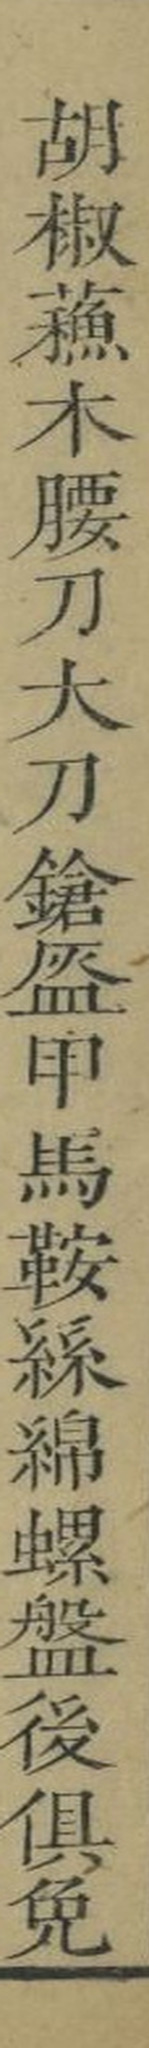胡椒蘇木腰刀大刀鎗盔甲馬鞍糸綿螺盤後俱免
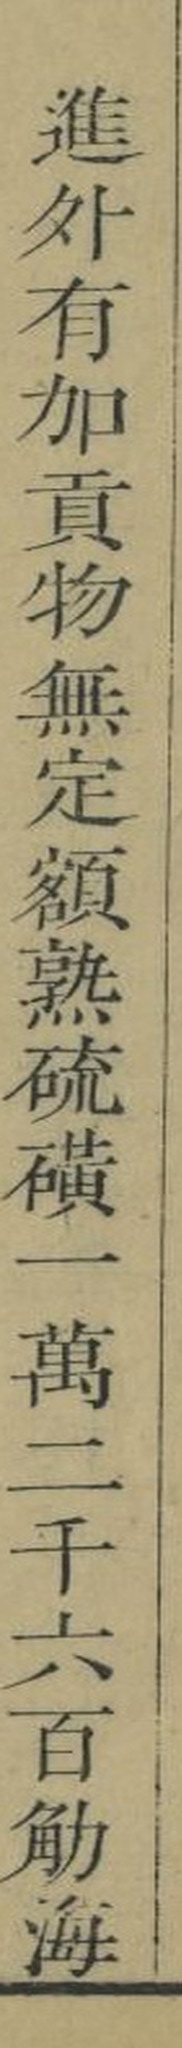進外有加貢物無定額熟硫磺一万二千六百觔海
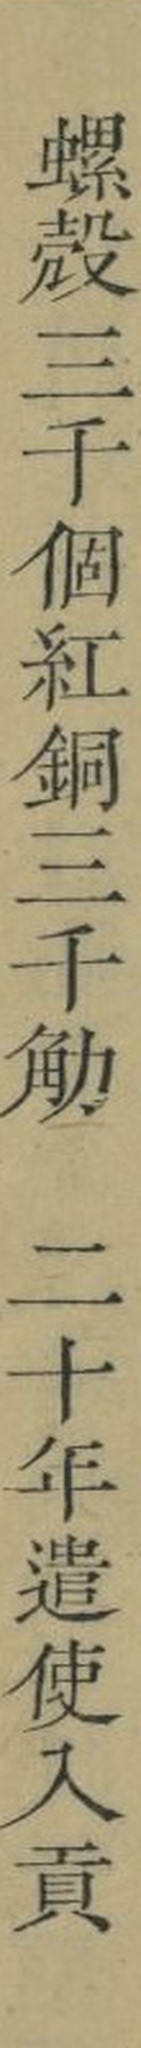螺殻三千個紅銅三千觔二十年遣使入貢
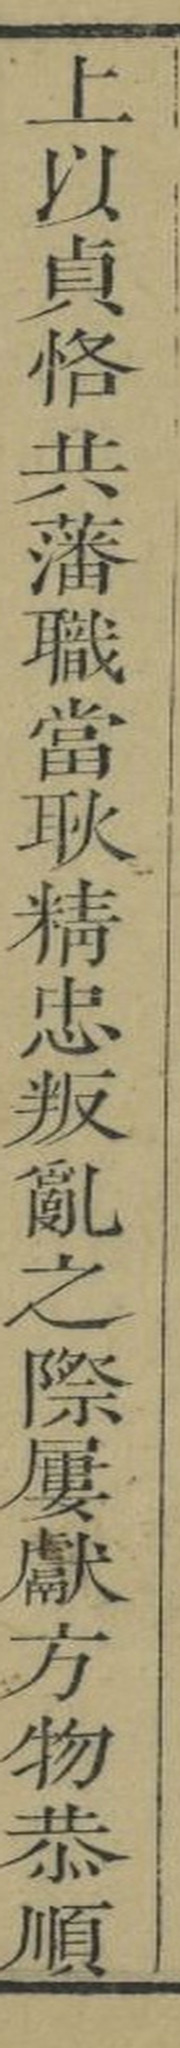上以貞恪共藩職当耿精忠叛乱之際屢献方物恭順
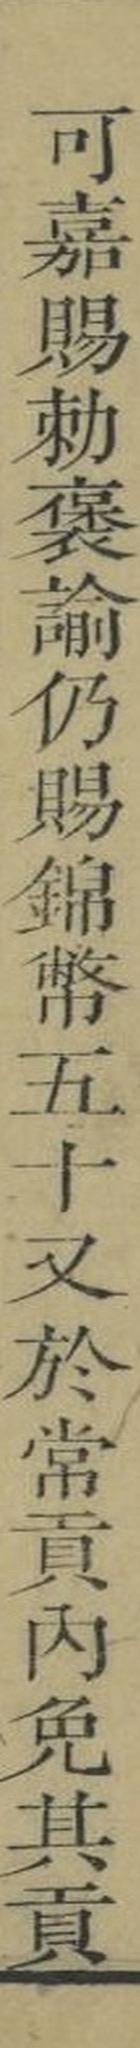可嘉賜勅褒諭仍賜錦幣五十又於常貢内免其貢
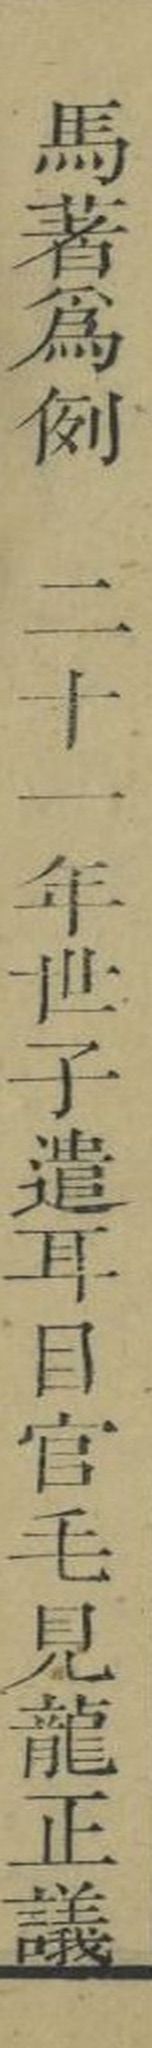馬著為例二十一年世子遣耳目官毛見竜正議
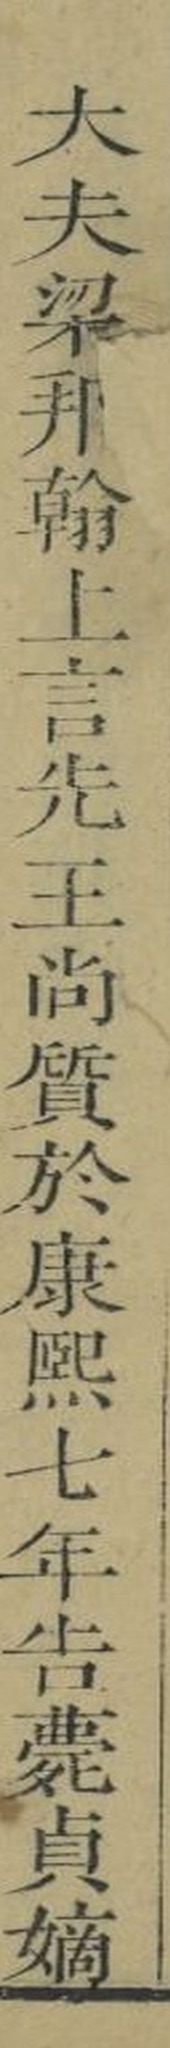大夫梁邦翰上言先王尚質於康煕七年告薨貞嫡
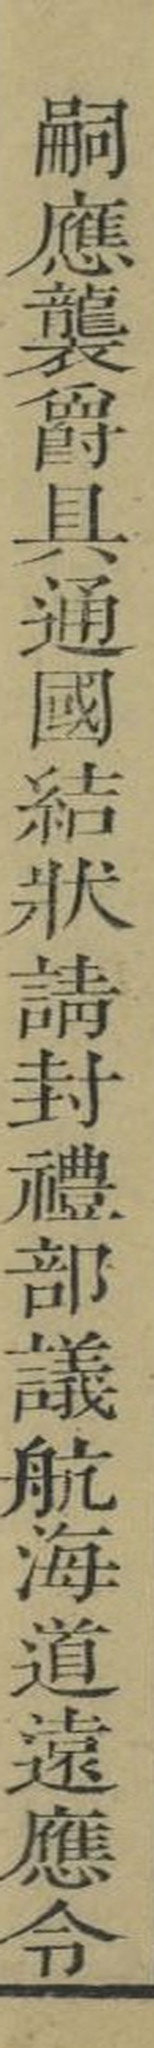嗣応襲爵具通国結状請封礼部議航海道遠応令
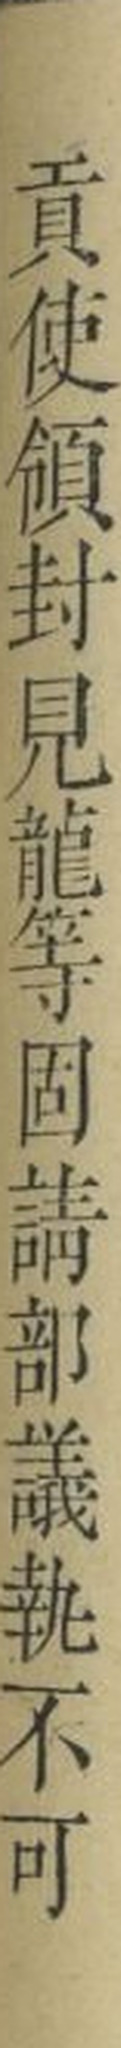貢使領封見竜等固請部議執不可
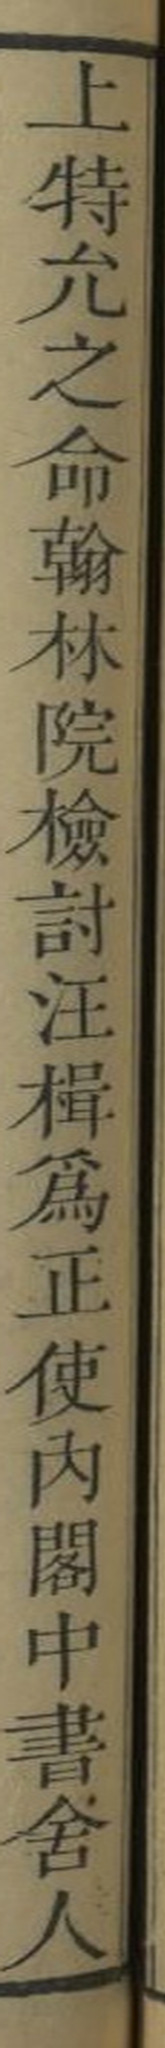上特允之命翰林院検討汪楫為正使内閣中書舎人
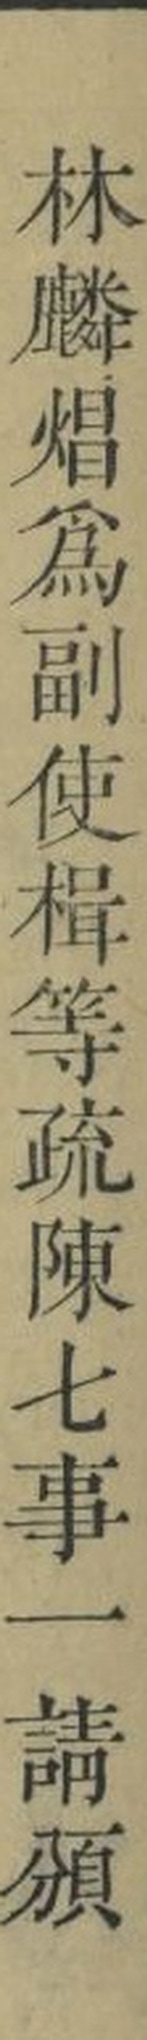林麟焻為副使楫等疏陳七事一請頒
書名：中山伝信録 巻三
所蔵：University of the Ryukyus Library
